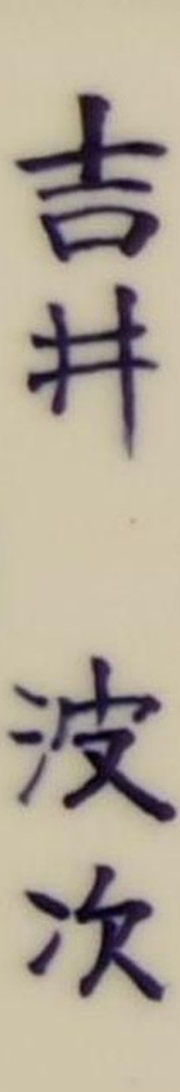吉井波次
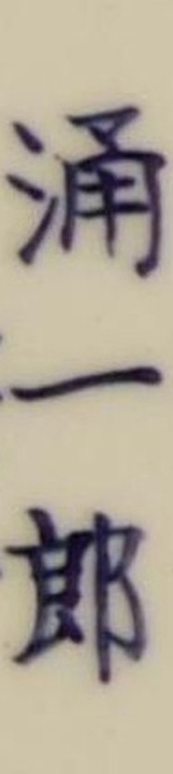涌一郎

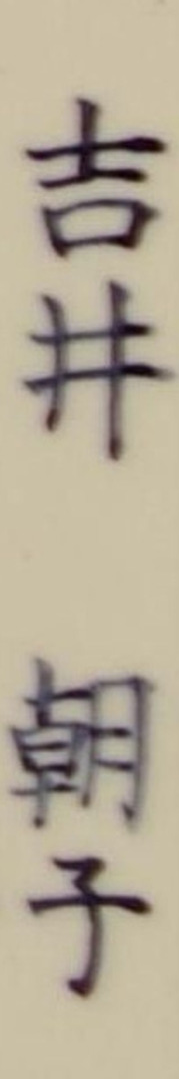吉井朝子
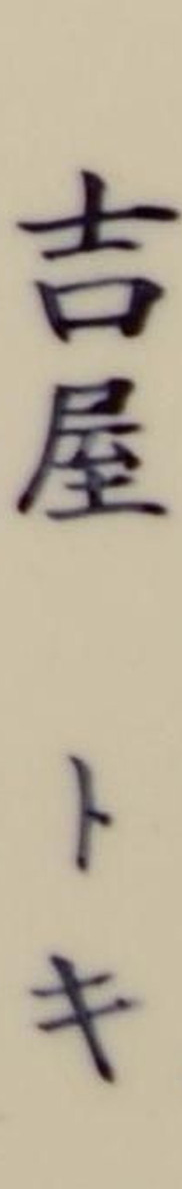吉屋トキ
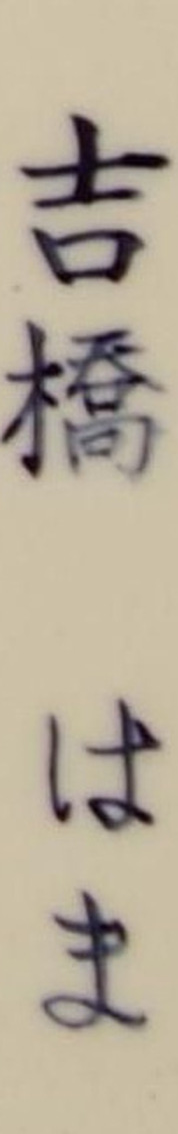古橋はま
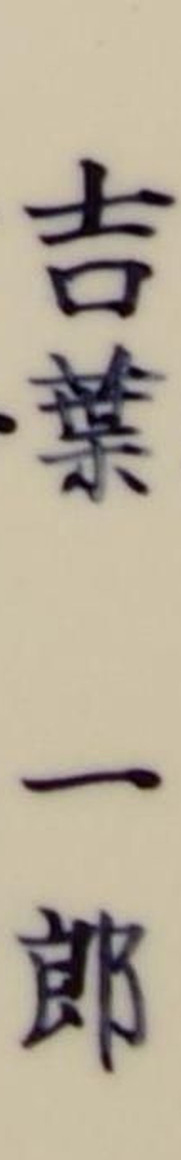古葉一郎
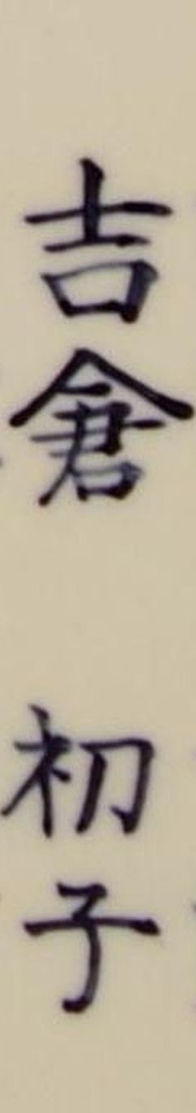吉倉初子
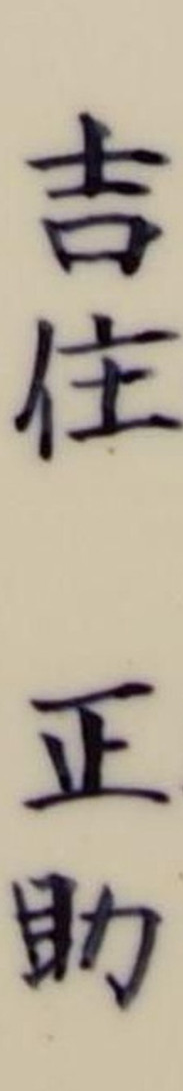吉住正助
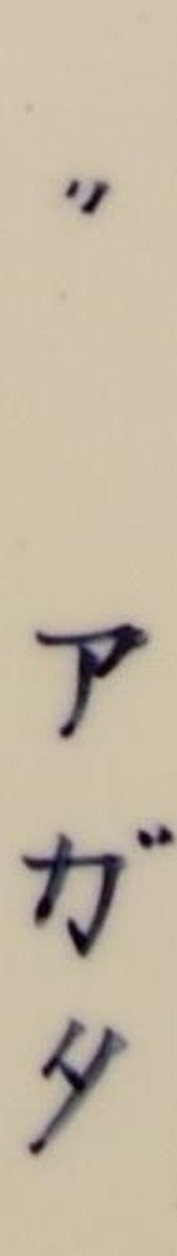アガタ
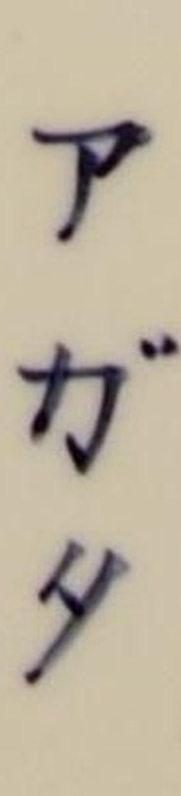アガタ
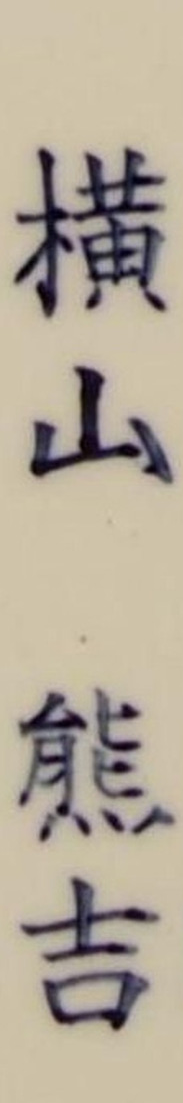横山熊吉

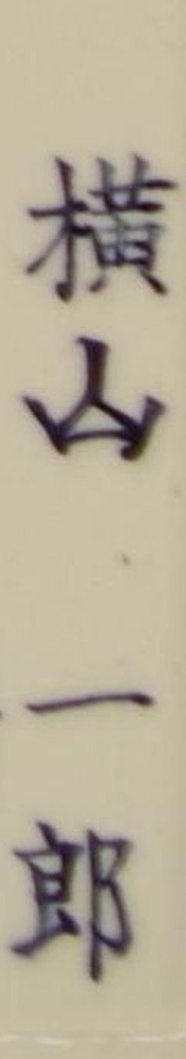横山一郎
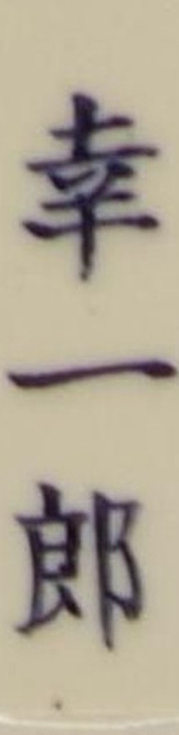幸一郎
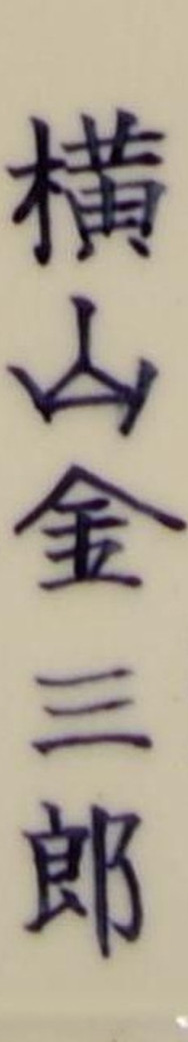横山金三郎
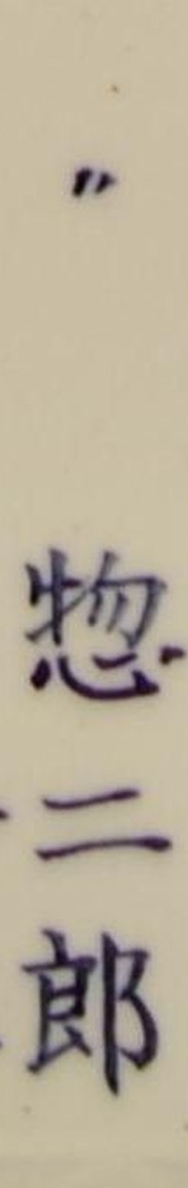惣二郎
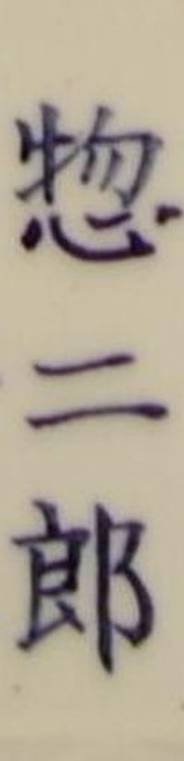惣二郎
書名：A~D
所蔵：koyasan kongobuji
